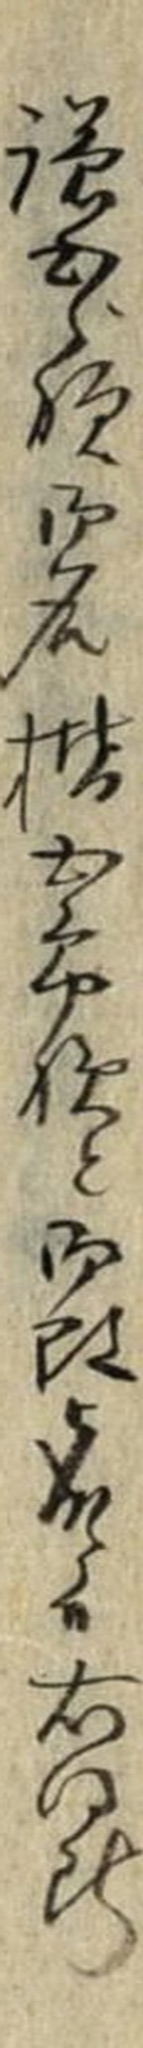謙五郎様御名楷五郎様と御改被成候に付右同断
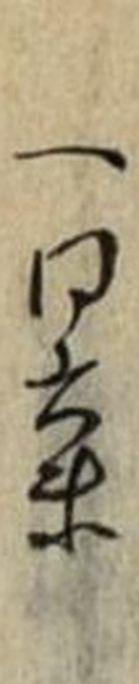一同六未
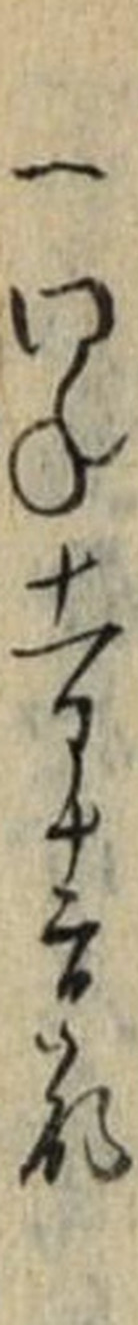一同年十一月十二日御触
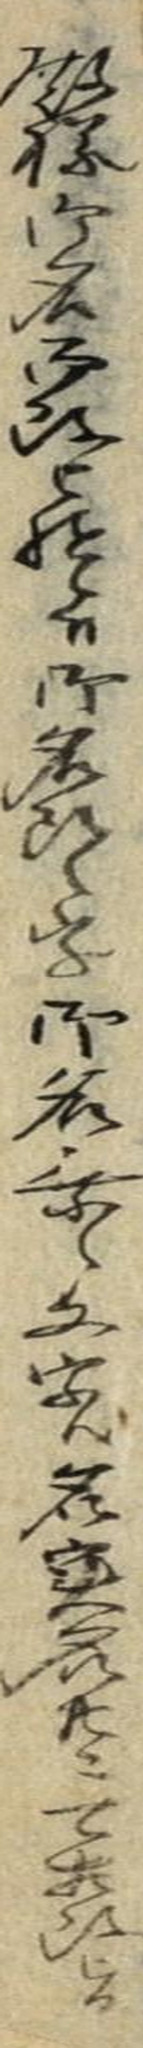殿様御名御改被遊候に付御名頭之字御名乗之文字は名実名共に可相改旨
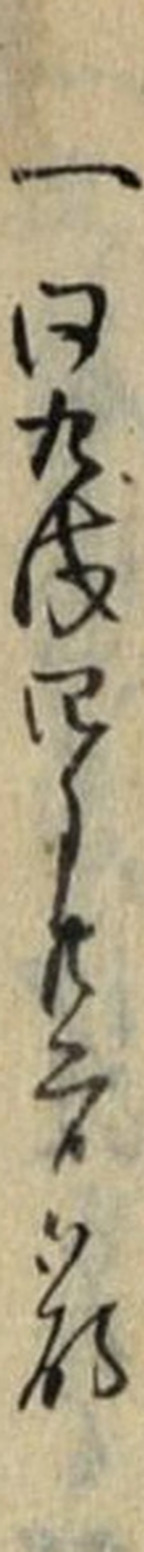一同九戌四月廿二日御触
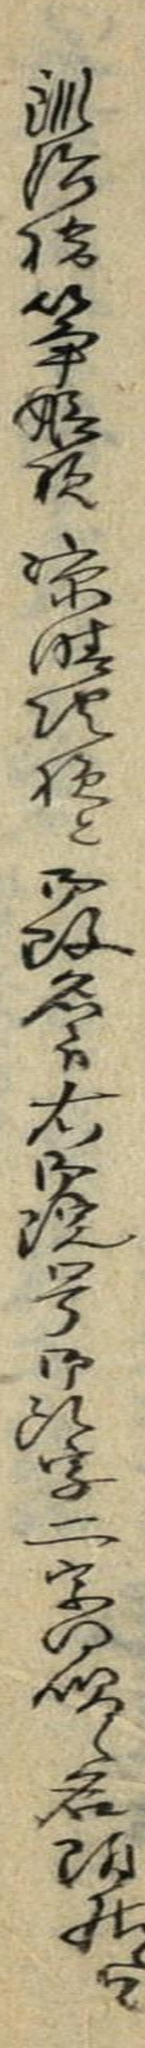鍛冶橋箏姫様凉晴院様と御改名に付右御院号御頭字二字同唱之名附居候はゝ
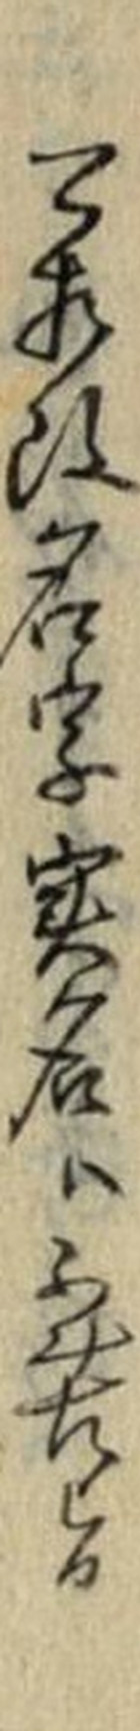可相改名字実名は不苦旨
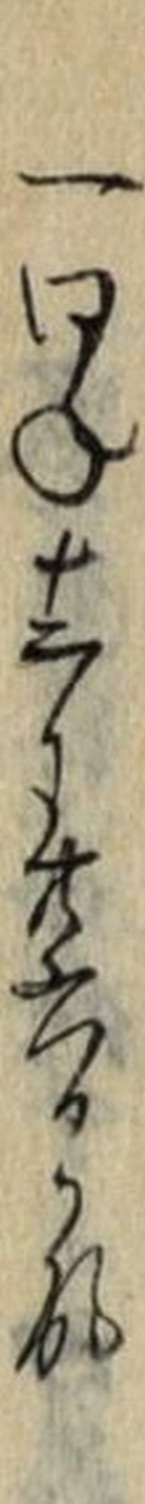一同年十二月廿六日御触
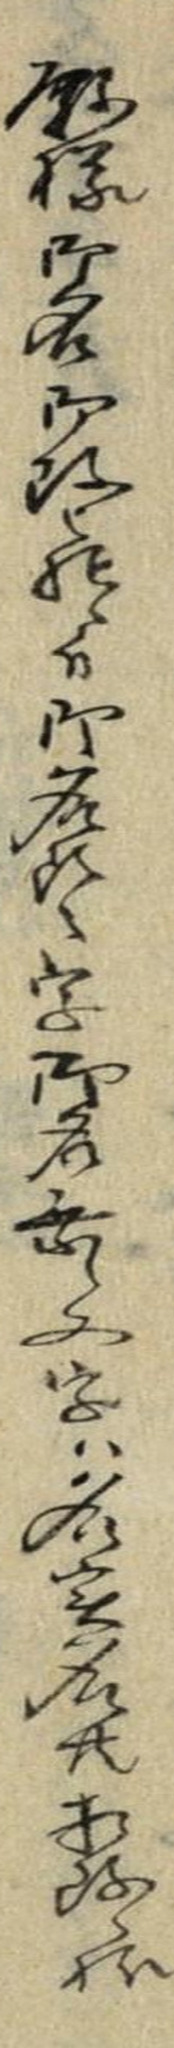殿様御名御改被遊候に付御名頭之字御名乗之文字は名実名共に相改候様
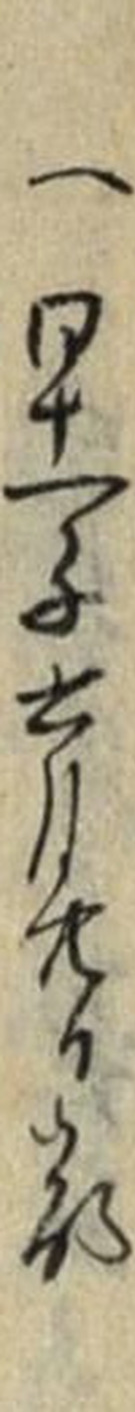一同十一子六月廿日御触
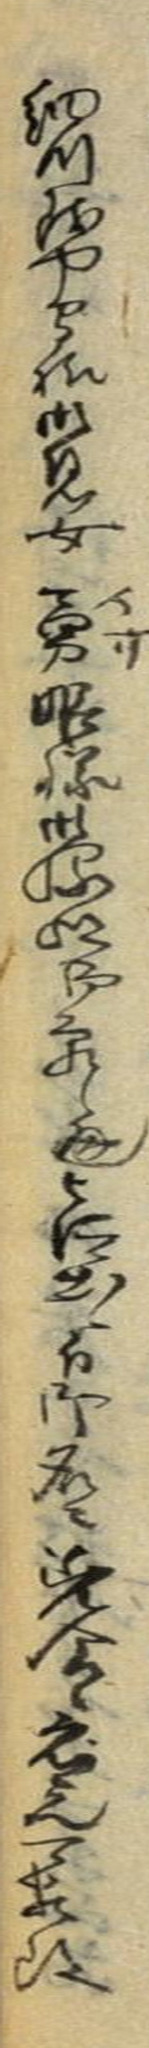細川越中守様御息女勇姫様御縁組御願之通被仰出候付御名に差合候名元可相改
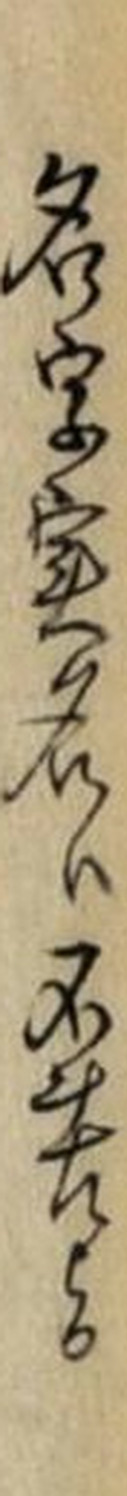名字実名は不苦旨

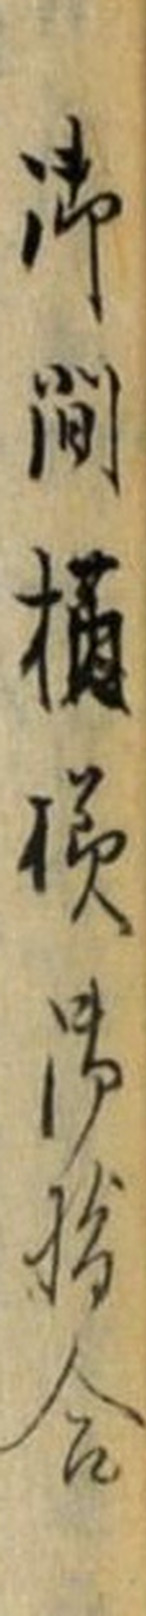御間柄様御指合
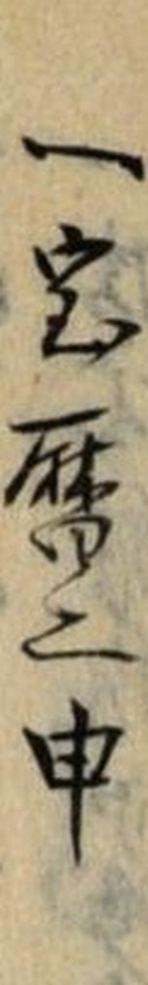一宝暦二申
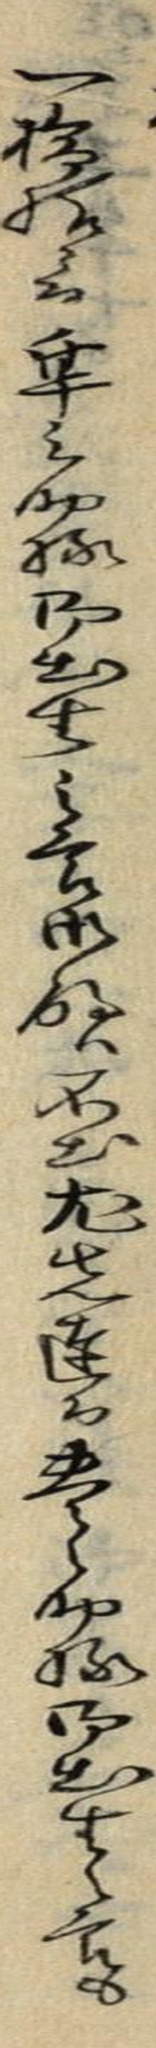一橋様に而隼之助様御出生之節御触は不出尤先達而豊之助様御出生之節も
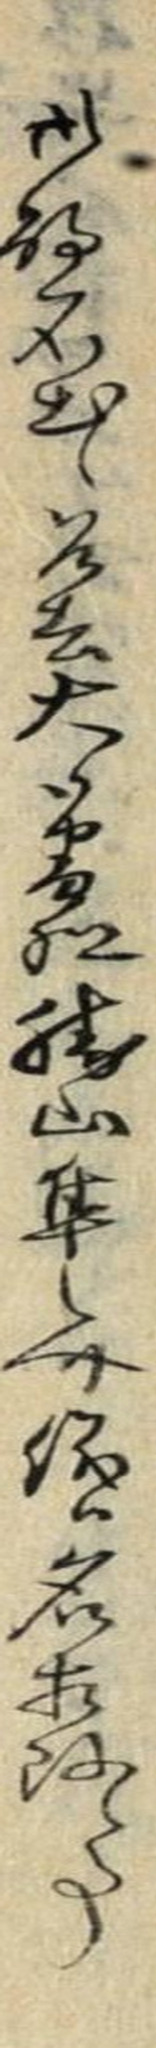御触不出候乍去大御番組勝山隼之介儀は名相改候事
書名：蒐輯之部
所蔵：福井県文書館 Fukui Prefectural Archives
